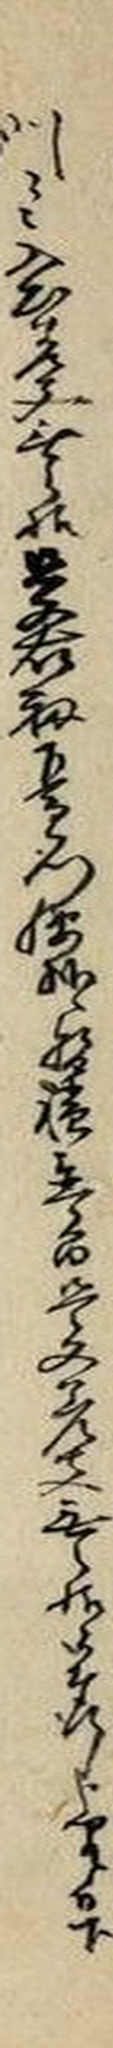門々々入出差支無之候様且又右籾下馬御門腰掛へ暫積置候間是又差支無之様御奉行被申聞候に付下
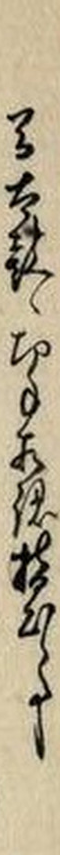馬太鼓へ切手相認指出候事
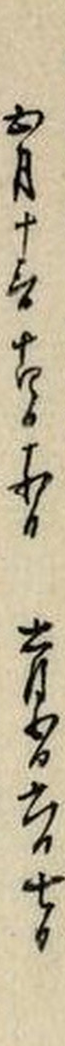五月十三日十四日十五日六月五日六日七日
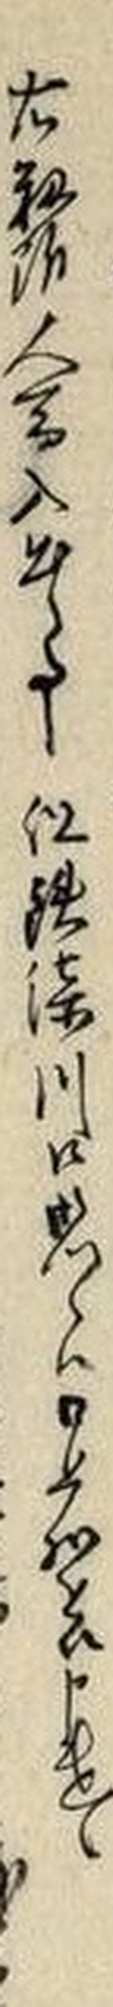右籾附人馬入出候事但鉄漆川口御門は口上扣を以申遣候
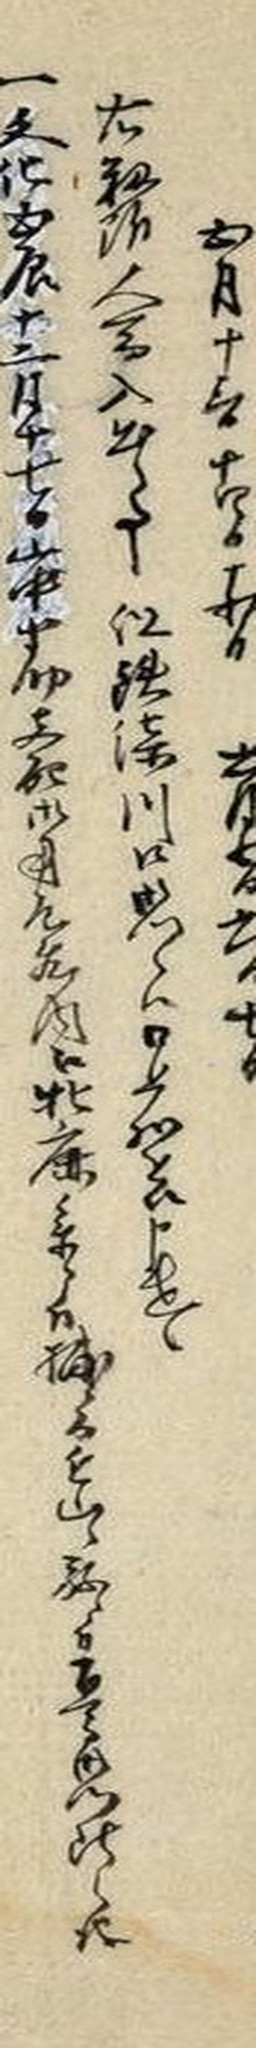一文化五辰十二月十七日山中半助支配御用屋敷内へ牝鹿参り候に付捕候而近山へ放候に付下馬御門断之儀
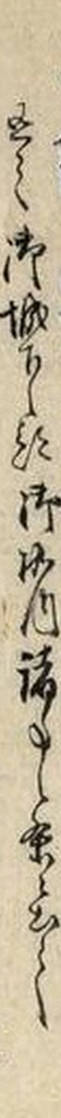有之御城下之部御城内諸事之条に出之
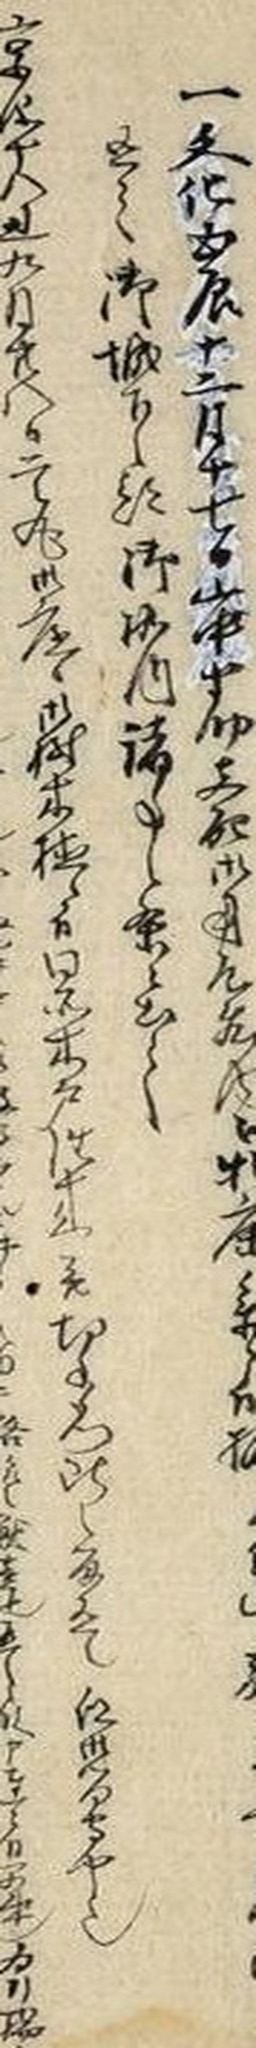一享保十八丑九月廿八日二之丸御庭へ御樹木植候に付同所木戸往来并切手御門断之留有之但御留守中也
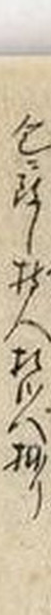包に致し持人拾弐人掛り

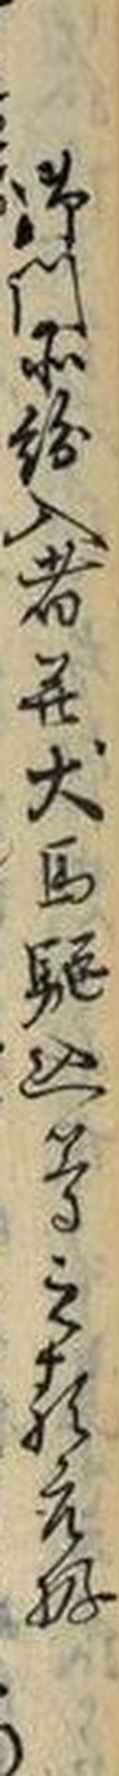御門所紛入者并犬馬駆込等之類取扱
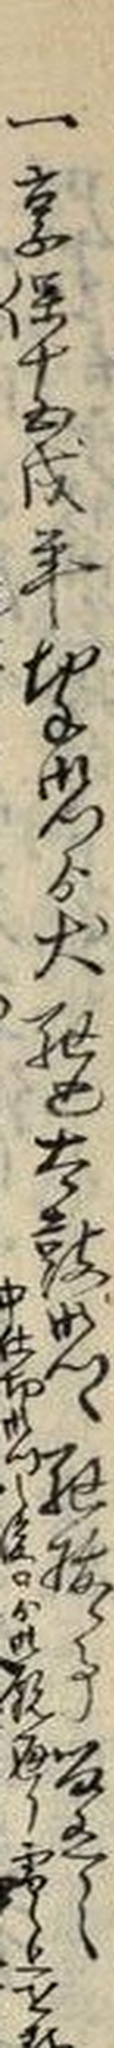一享保十五戌年切手御門ゟ犬駆込太鼓御門へ駆抜候事留有之
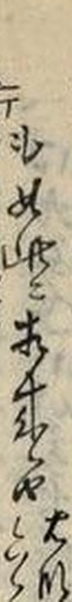も如此ニ相成候由
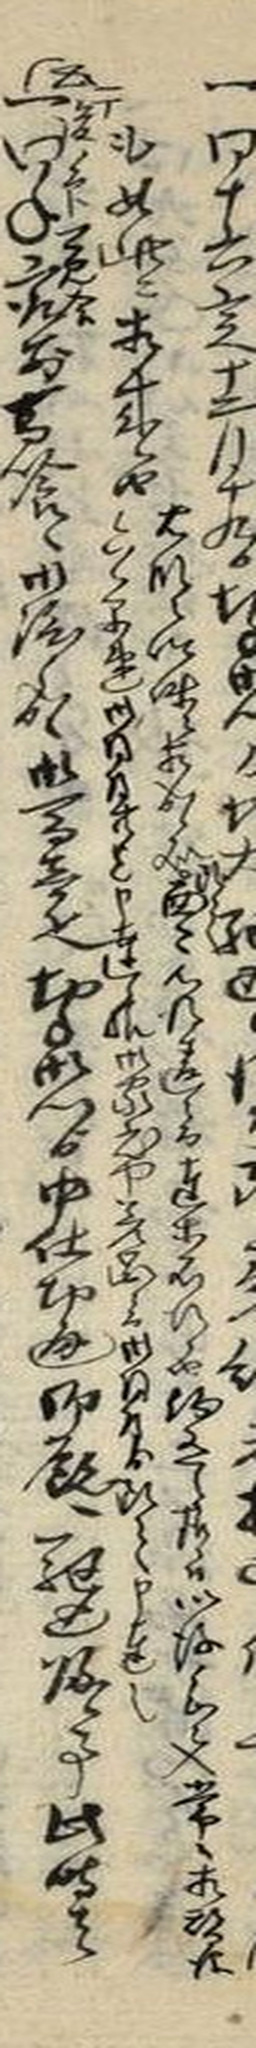一同年最前馬喰へ御渡被成候御馬壱疋切手御門ゟ中仕切通御厩へ駆込帰候事此時者
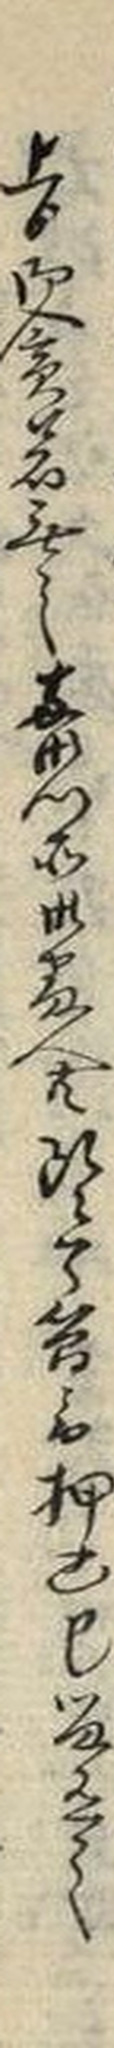上ゟ御貪着無之両御門所御番人共頭之了簡ニ而押込申候留有之
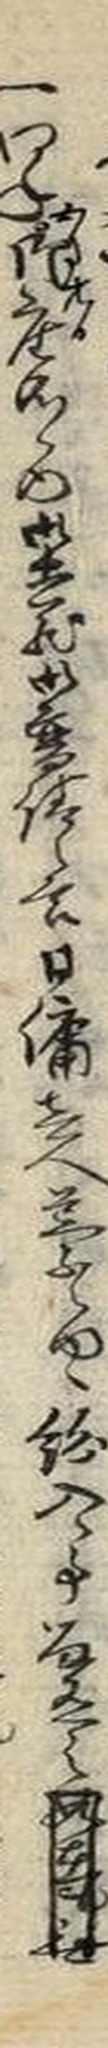一同年五月廿日御座所之内御土蔵御普請之節日傭壱人荒子之内へ紛入候事留有之
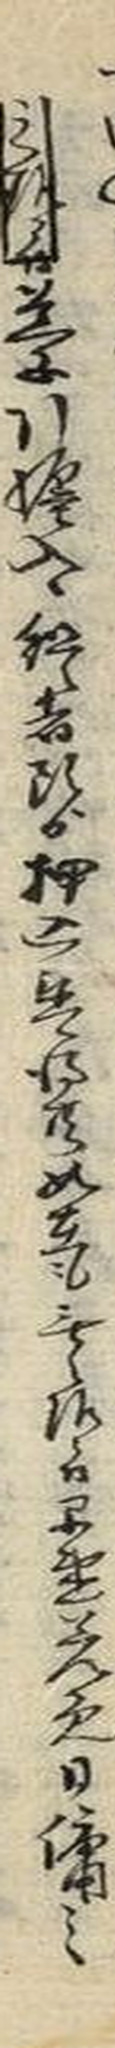荒子引纏入候組之者頭ゟ押込置候得共如在も無之趣ニ付早速差免日傭之
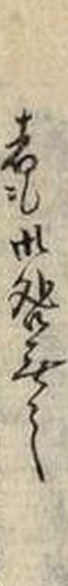者も御咎無之
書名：御門御櫓之部
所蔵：福井県文書館 Fukui Prefectural Archives
